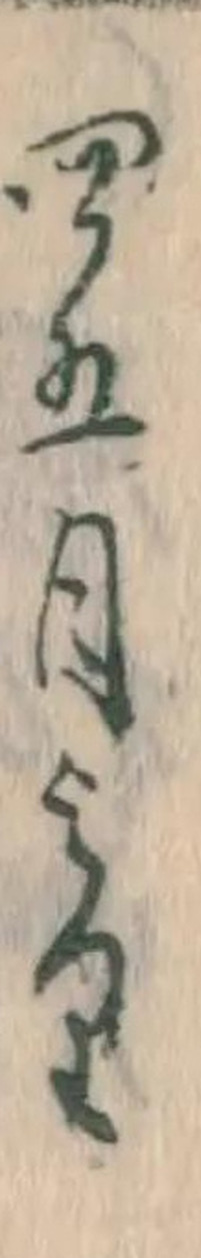四五月より
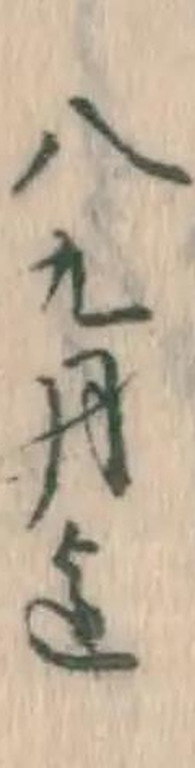八九月迄
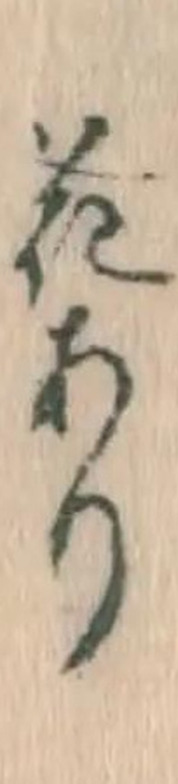花あり
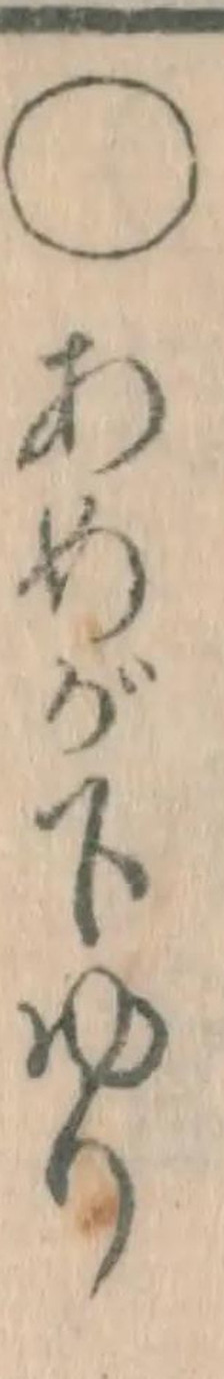〇あめが下ゆり
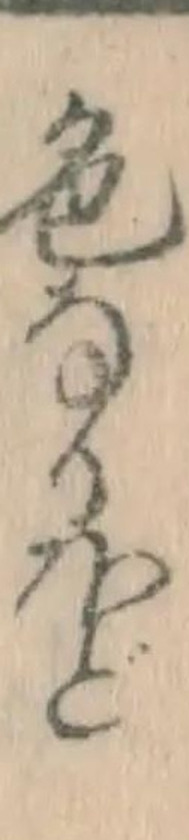色なるほど
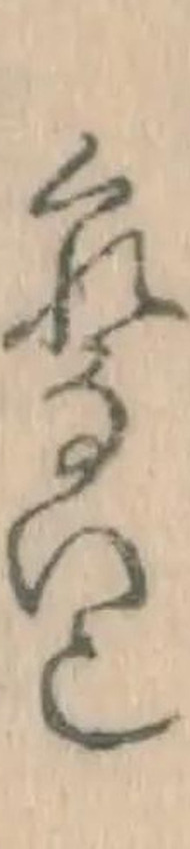くれない也
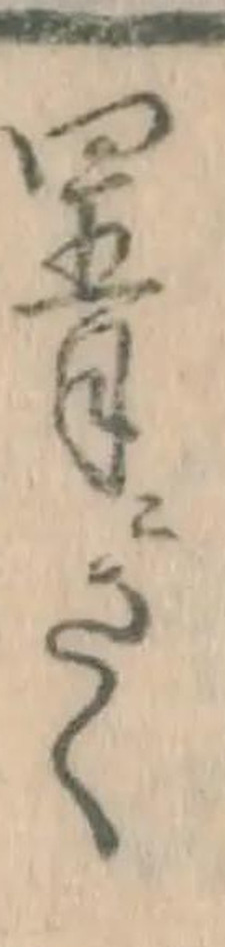四五月にさく
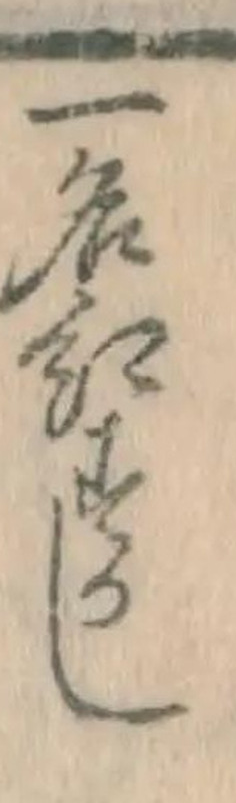一名紅すかし
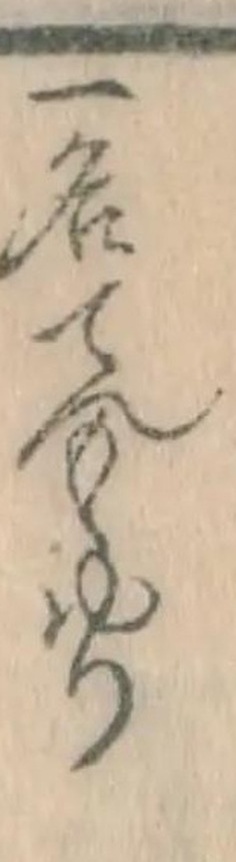一名てんもゆり

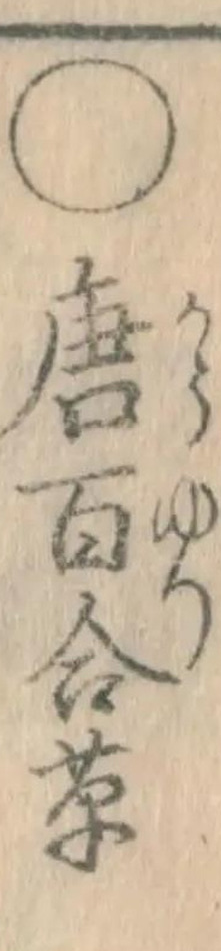〇唐百合草
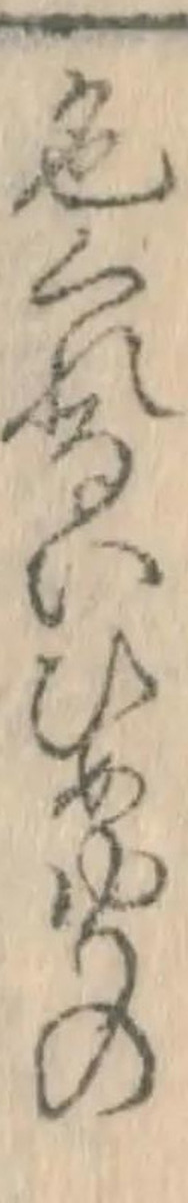色くれないひめゆりの
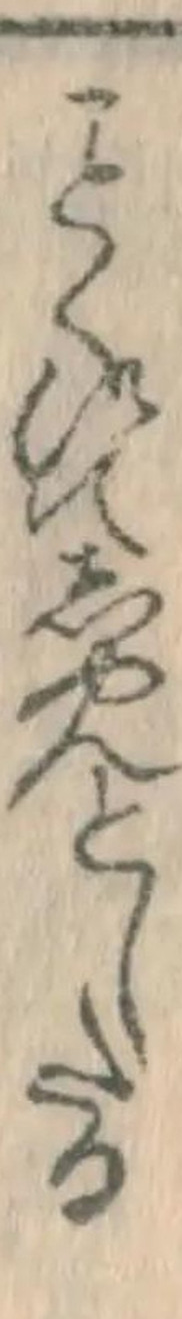ことくにてしやんとしたる
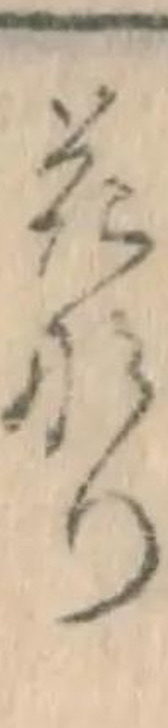花なり
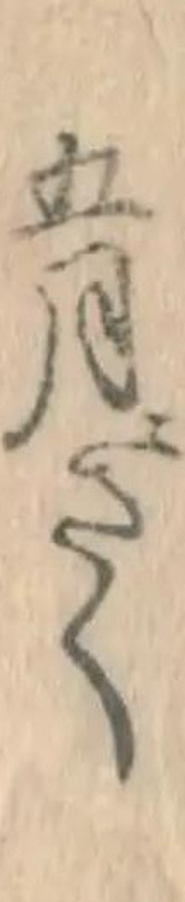五月にさく
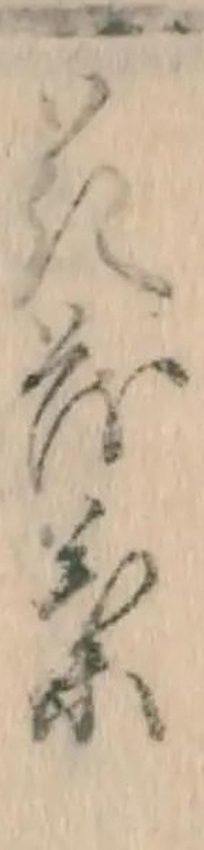花も葉
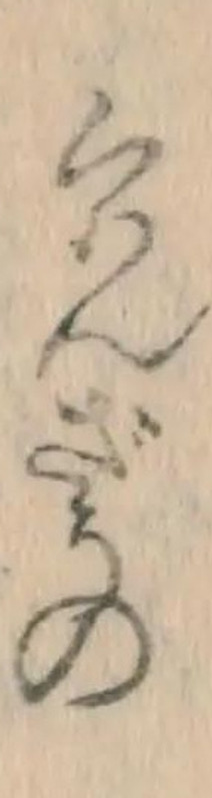くはんざうの
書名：艸花繪前集. [2]
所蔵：国立国会図書館 National Diet Library, JAPAN
